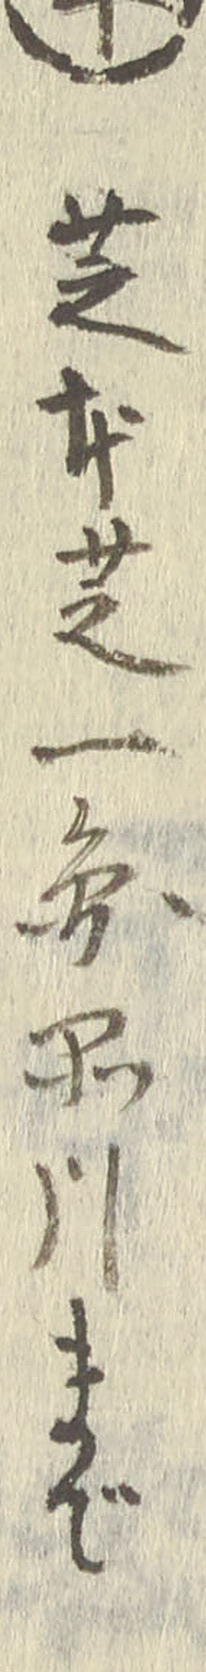二十芝本芝一圓品川まで
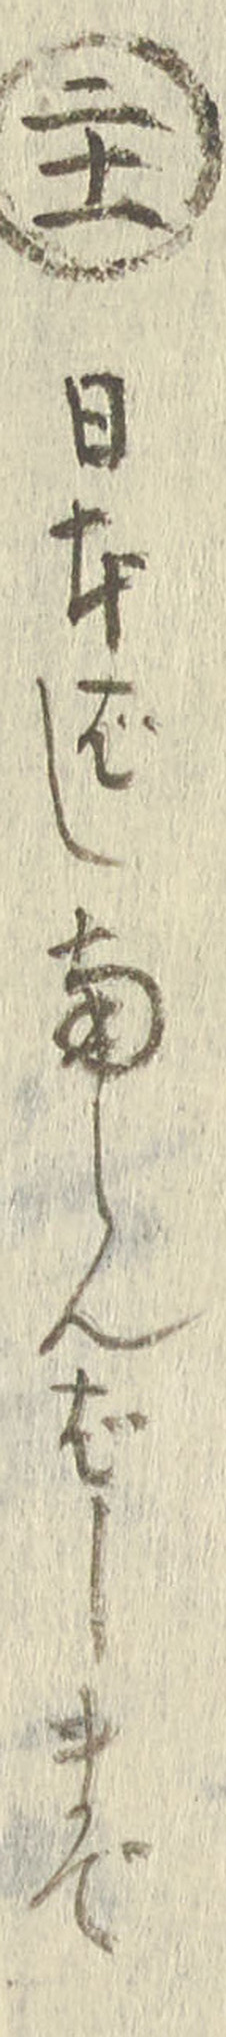二十一日本ばし南しんばしまで
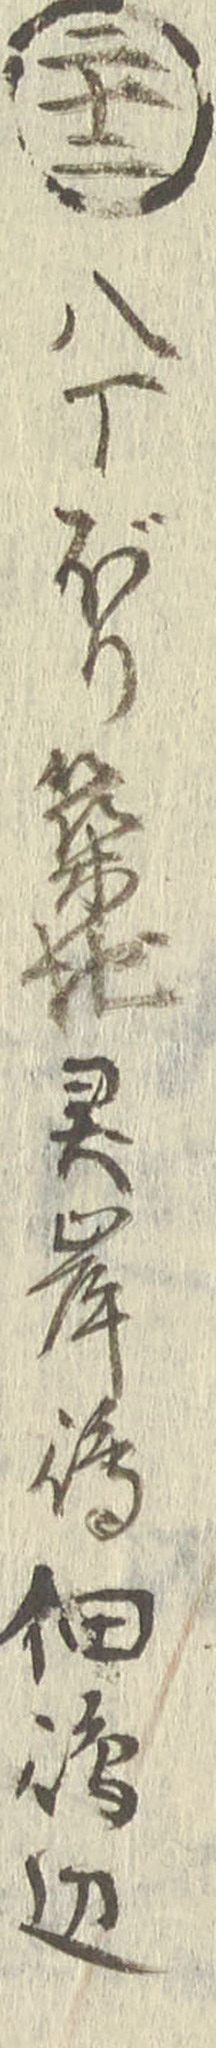二十二八丁ぼり築地霊岸嶋佃嶋辺
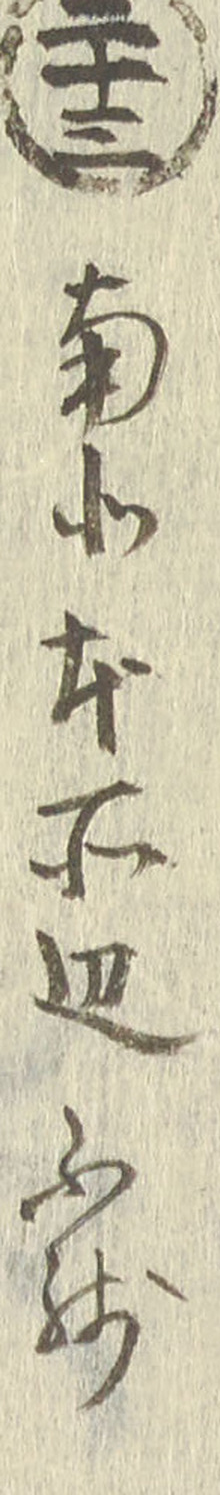二十三南北本所辺不残

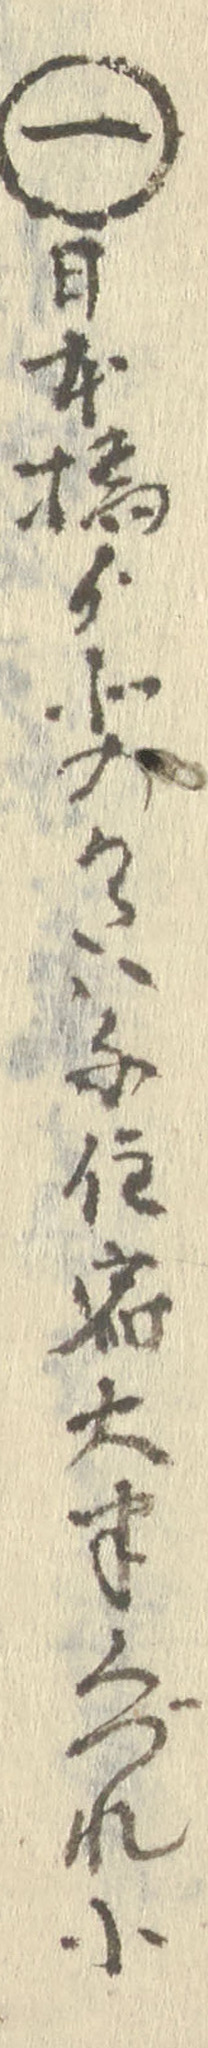一日本橋ゟ北のかたハ千住宿大半くづれ小
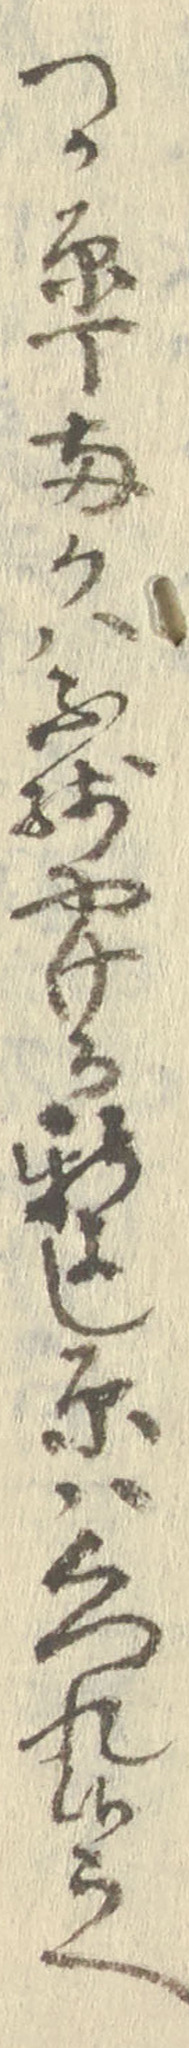つか原丁両かハ不残やける新よし原ハくつれ候うへ
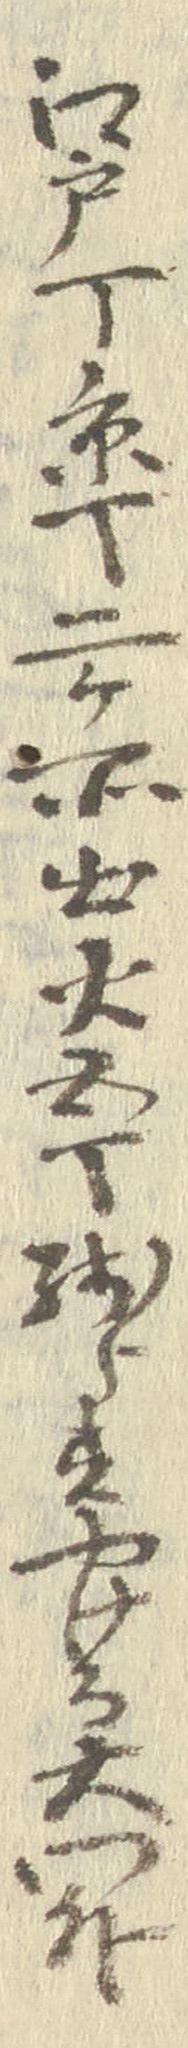江戸丁京丁二ヶ所出火五丁残らすやける大門外
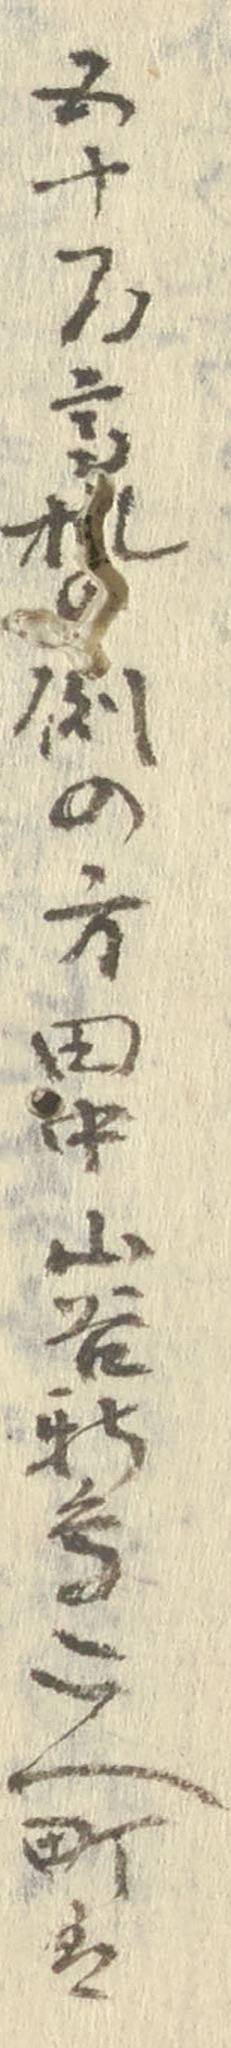五十間高札の側の方田中山谷新鳥こへ町は
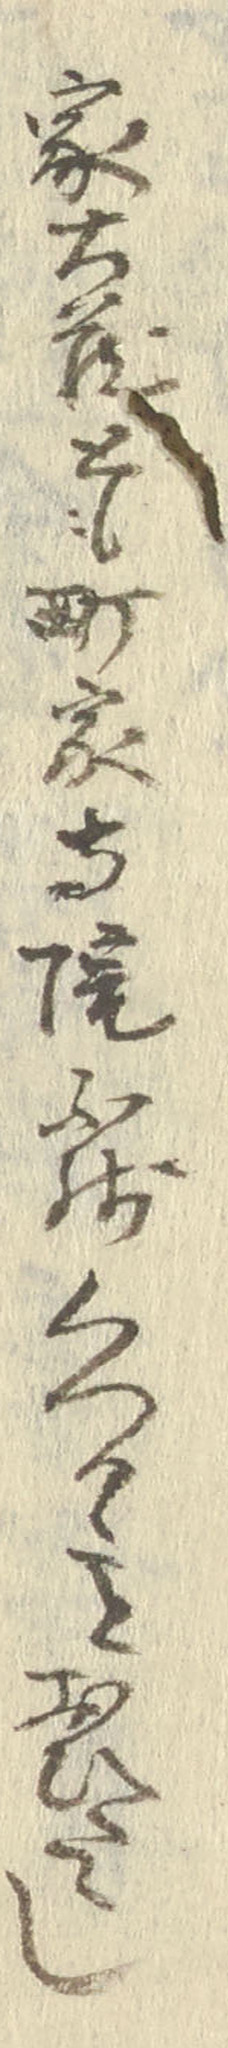家土蔵とも町家寺院不残くつるゝことおひたゝし
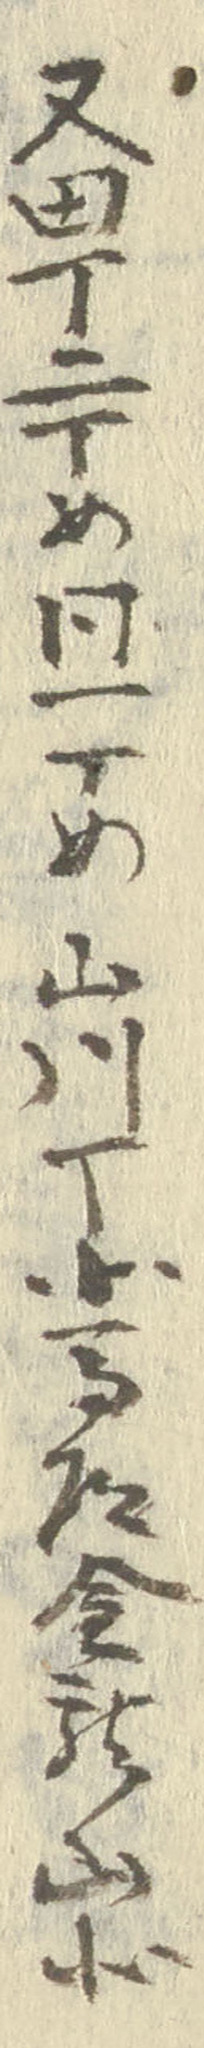又田丁二丁め同一丁め山川丁北馬道金龍山北
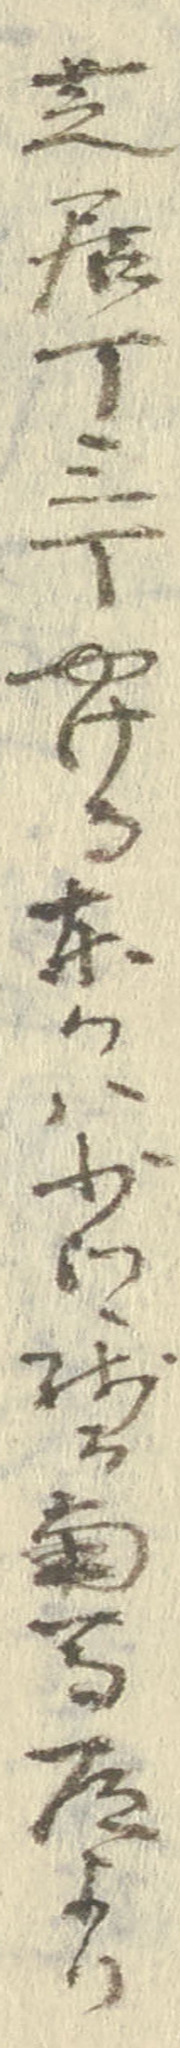芝居丁三丁やける東かハ少ツヽ残而南馬道より
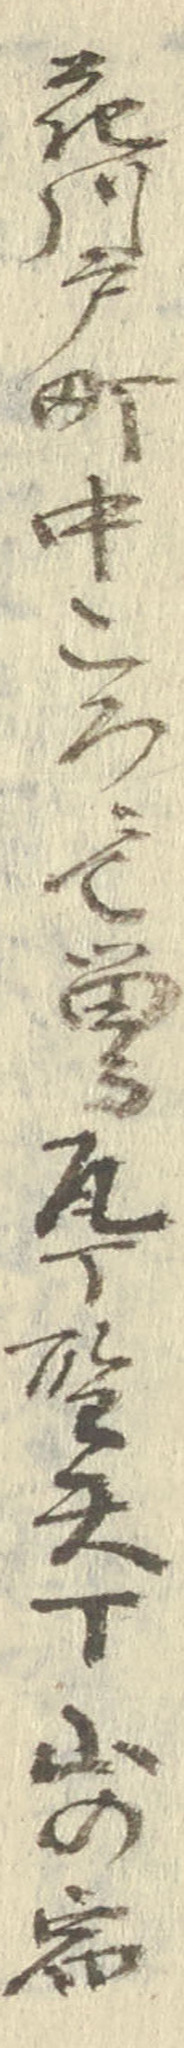花川戸町中ころニて留る瓦丁聖天丁山の宿
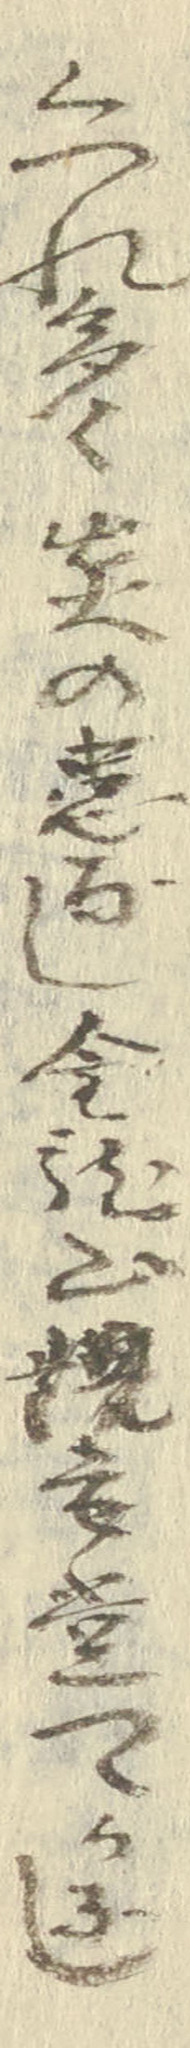くつれ多く出火の患なし金龍山観音堂つゝかなし
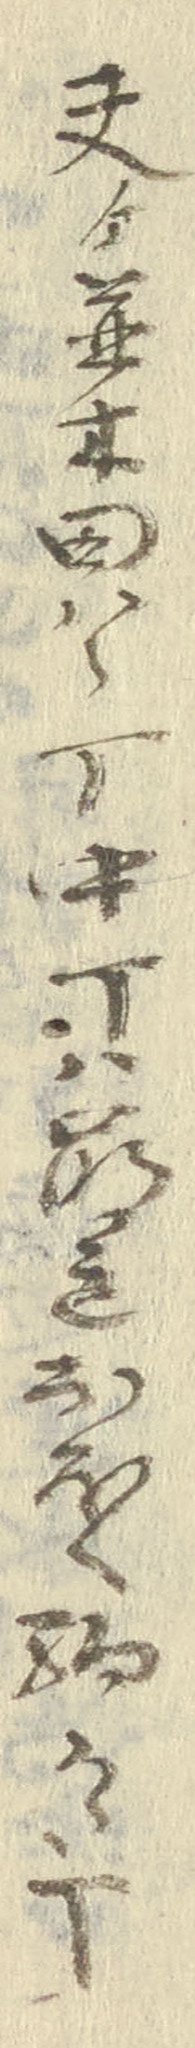夫ゟ並木田ハら丁中丁ハ崩れおほく駒かた丁
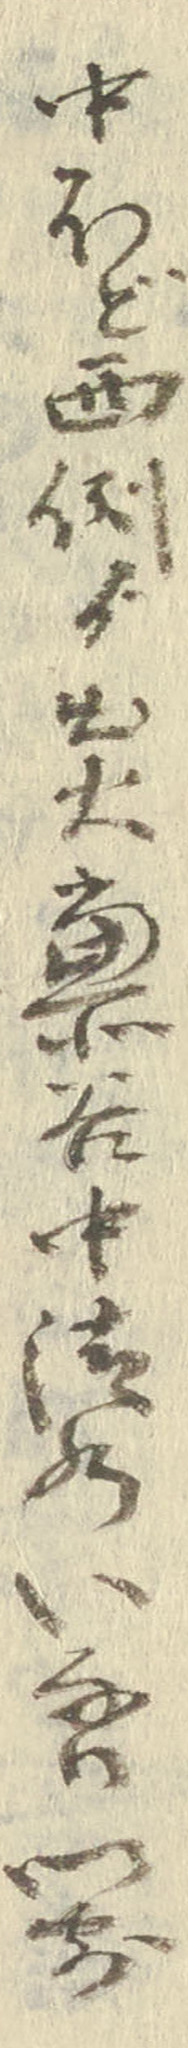中ほど西側ゟ出火當所谷中清水いなり門前
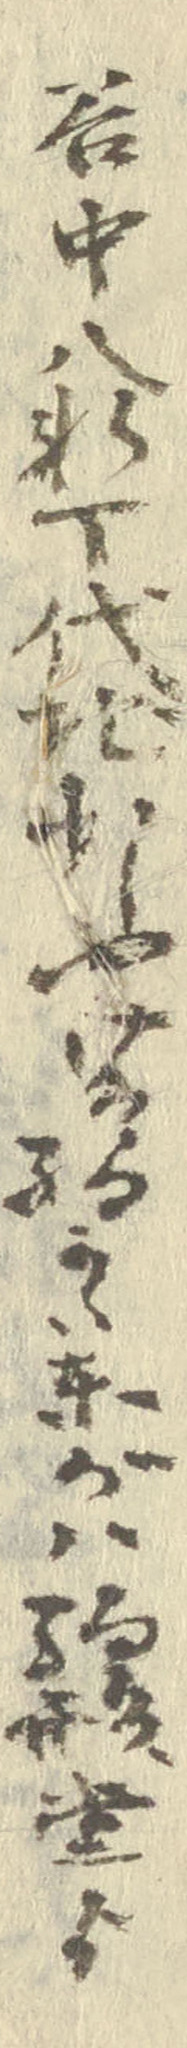谷中八軒丁代地少しやける駒かた東がハ駒形堂ゟ
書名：御府内御屋敷方市中共地震類焼場所明細書之冩兼街道筋近郷聞書
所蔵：東京大学総合図書館 General Library in the University of Tokyo, JAPAN
